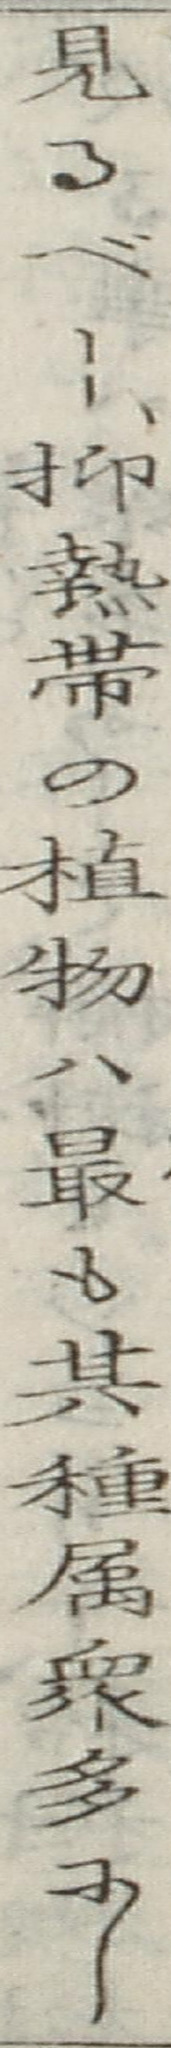見るべし、抑熱帯の植物は最も其種属衆多にし
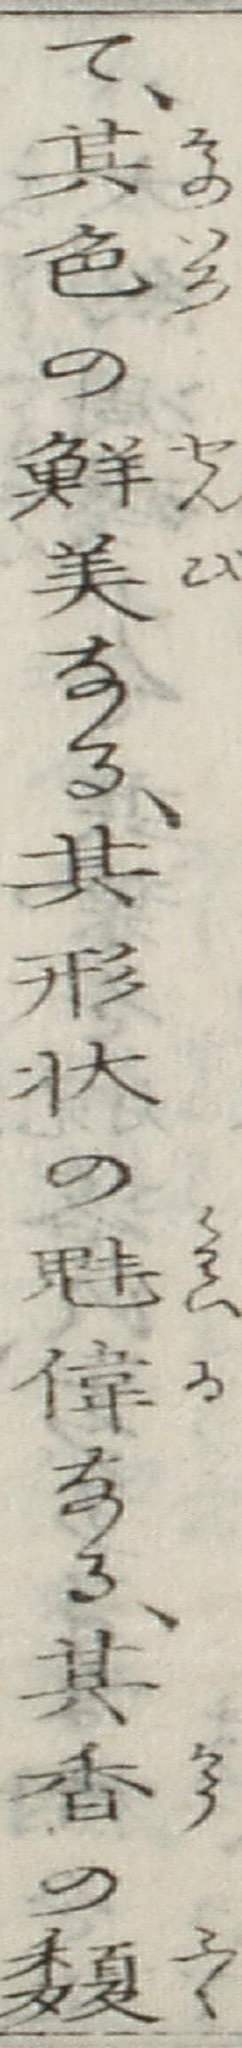て、其色の鮮美なる、其形状の魁偉なる、其香の馥
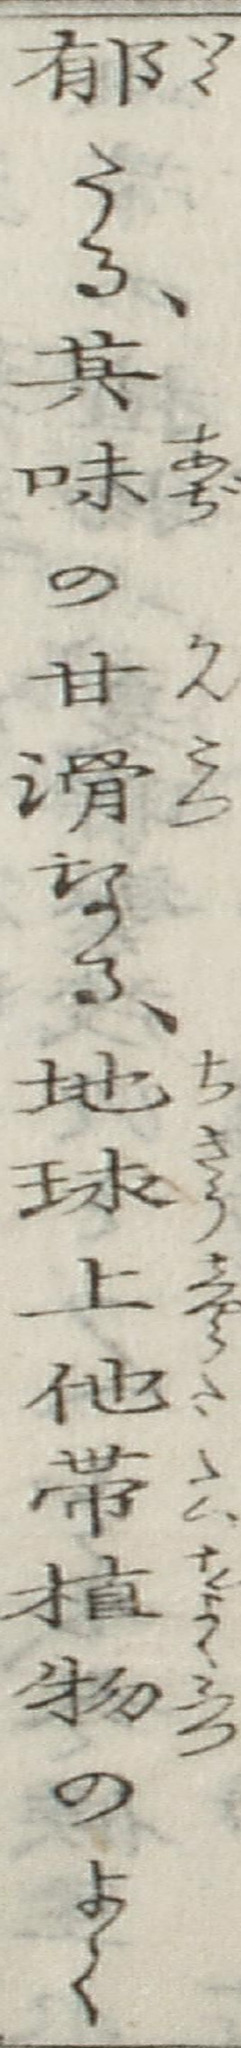郁たる、其味の甘滑なる、地球上他帯植物のよく
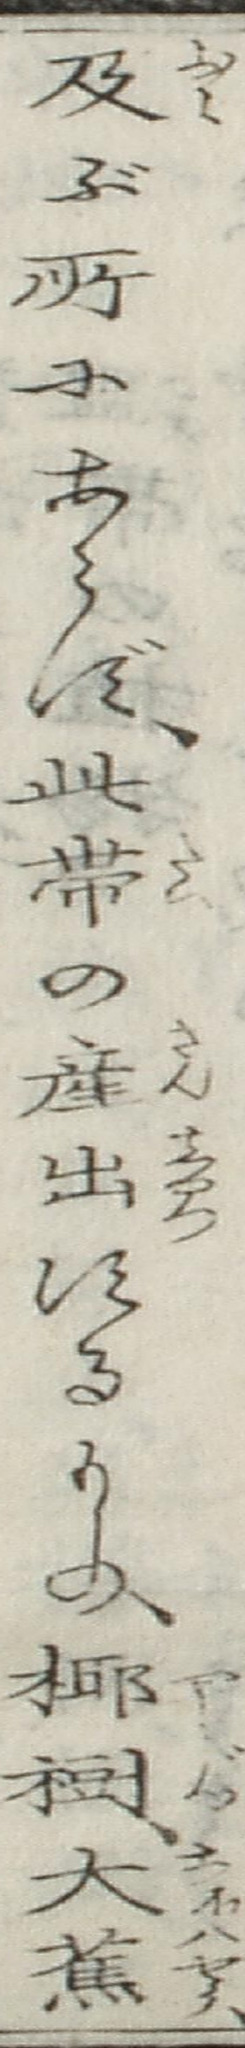及ぶ所にあらず、此帯の産出するもの、椰樹、大蕉、
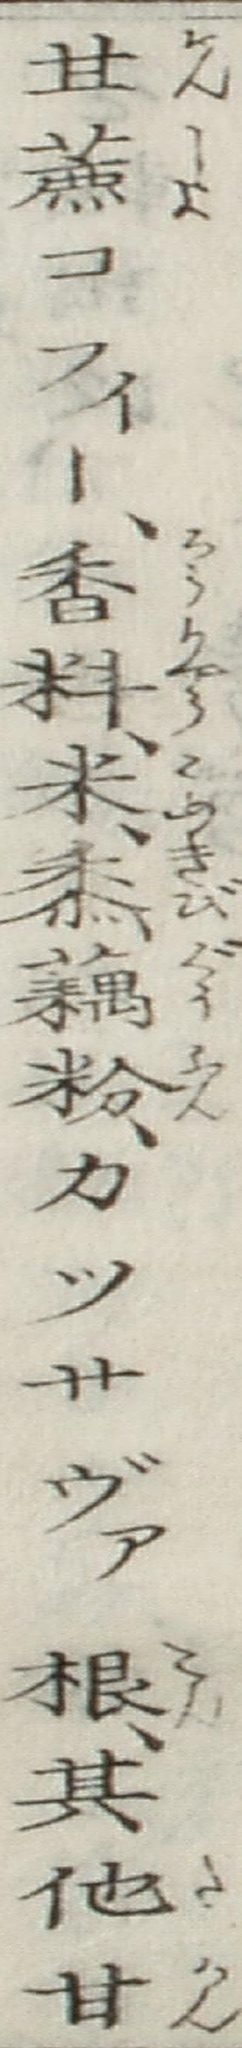甘藷コフィ―、香料、米、黍、藕粉、カツサヴァ根、其他甘
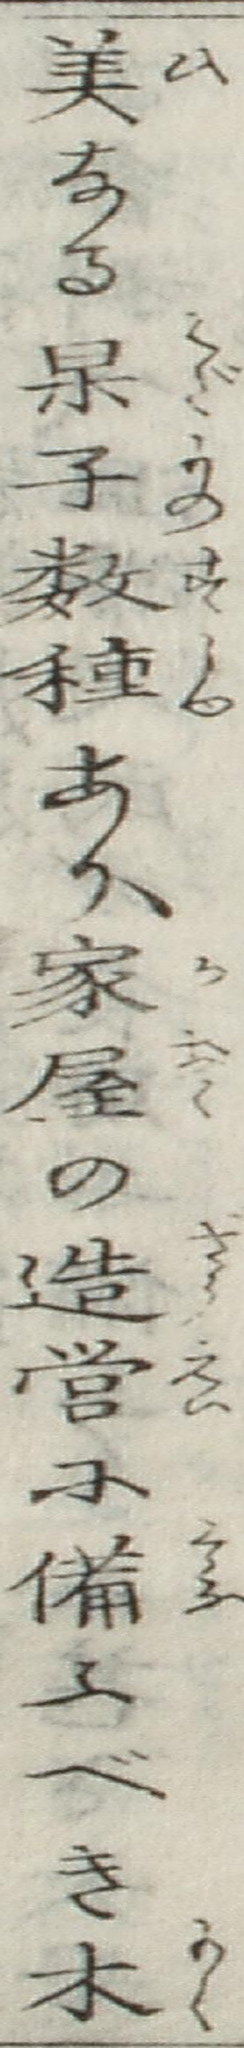美なる果子数種あり、家屋の造営に備ふべき木
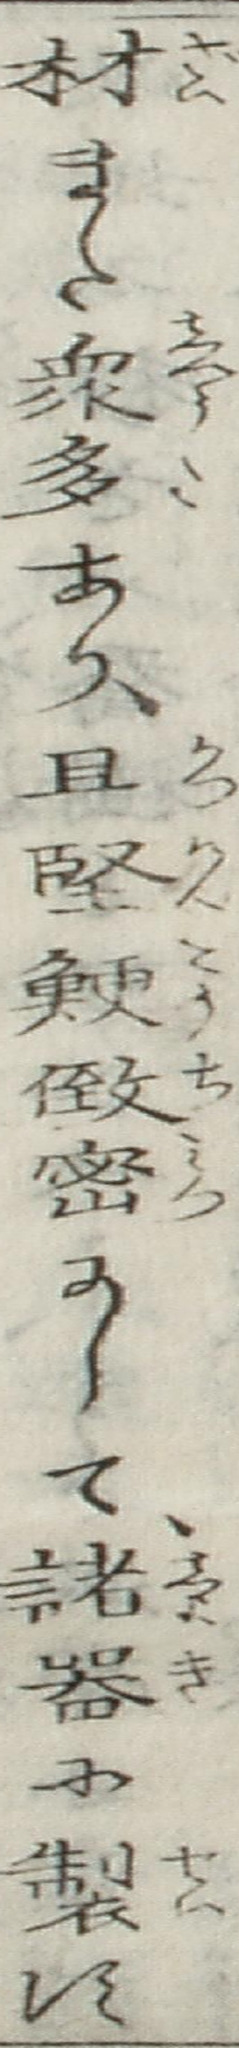材また衆多あり、且堅硬緻密にして諸器に製す
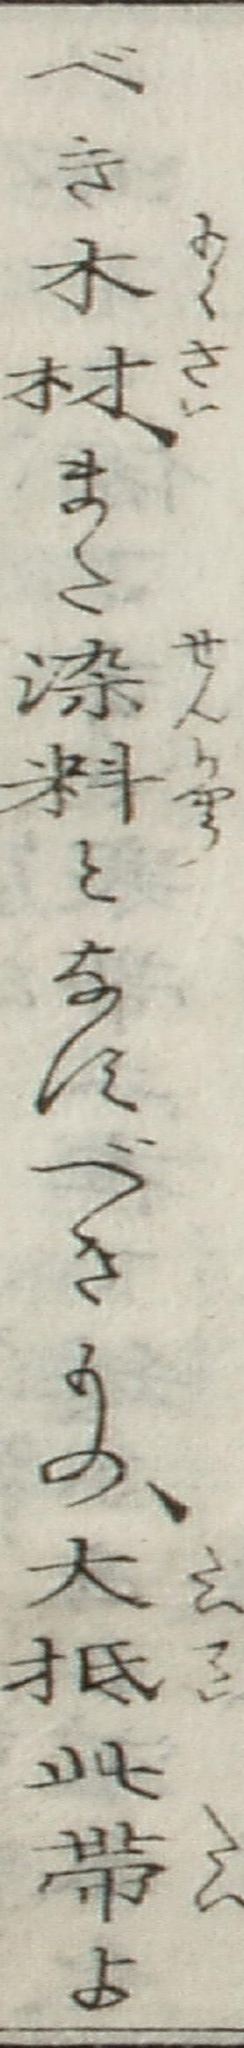べき木材、また染料となすべきもの、大抵此帯よ

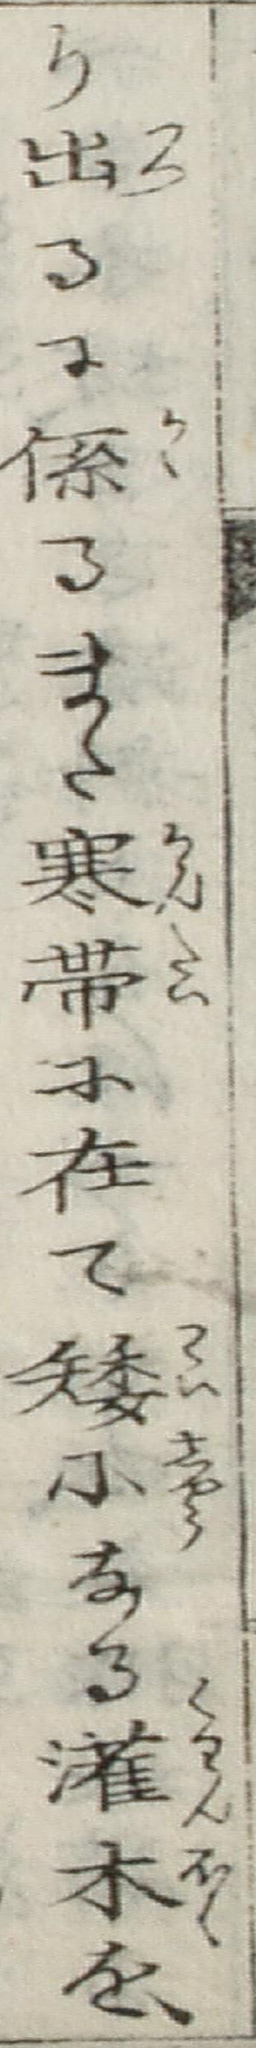り出るに係るまた寒帯に在て矮小なる灌木を、
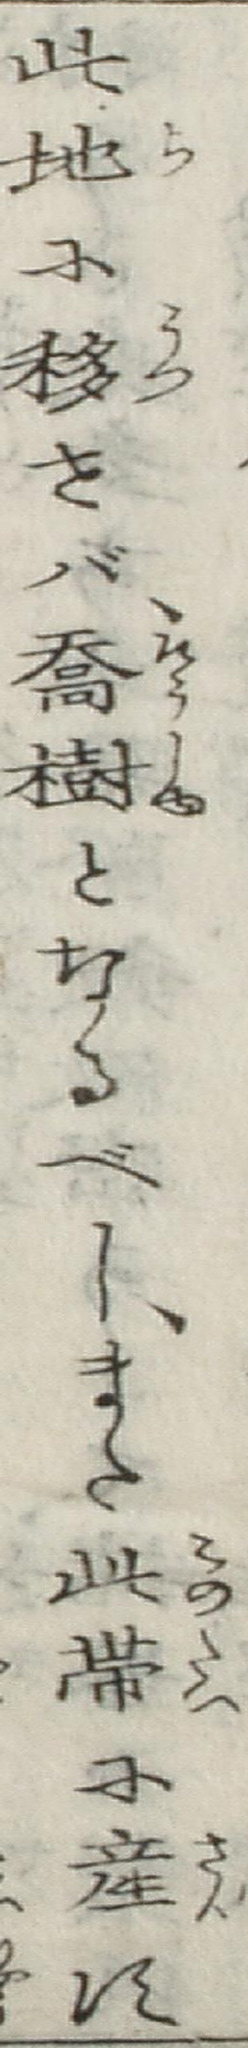此地に移せば、喬樹となるべし、また此帯に産す
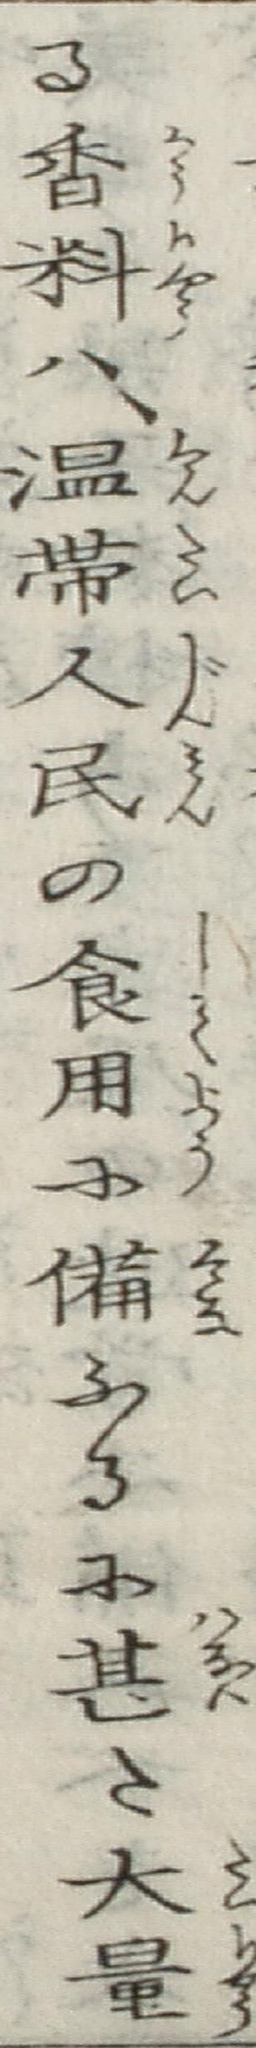る香料は、温帯人民の食用に備ふるに甚た大量
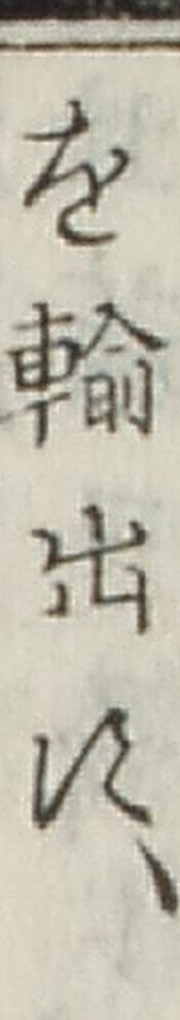を輸出す、
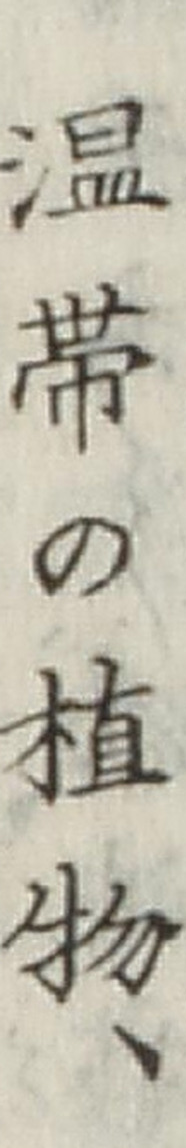温帯の植物、
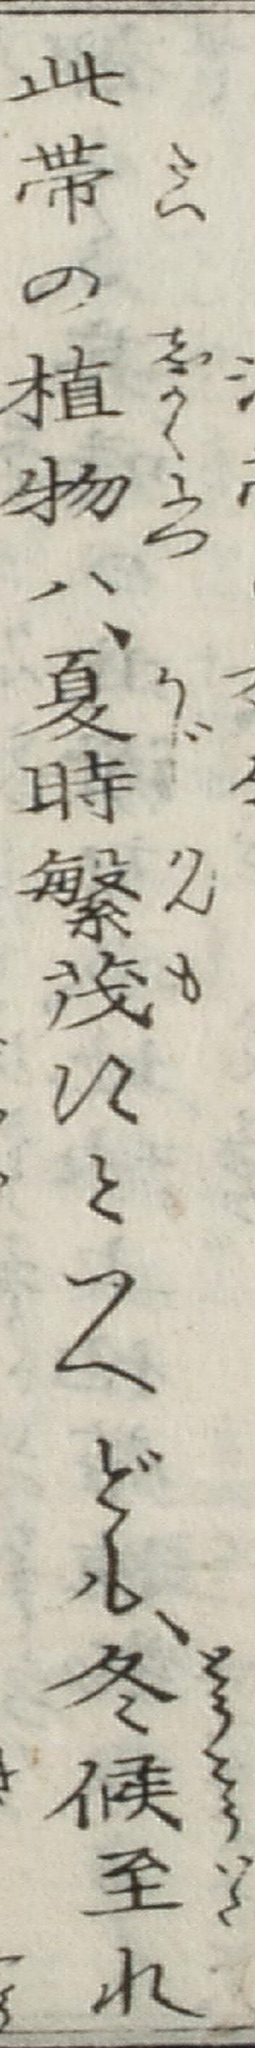此帯の植物は、夏時繁茂すといへども、冬候至れ
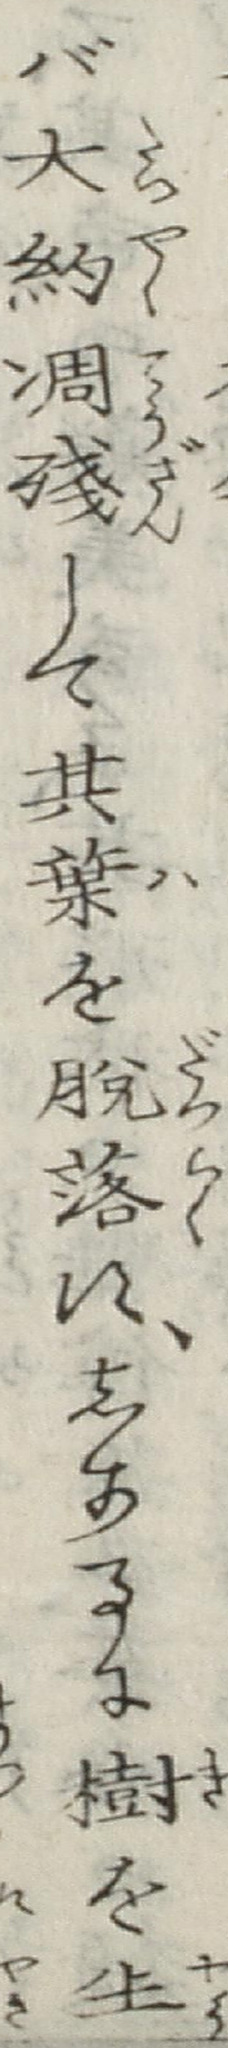ば大約凋残して其葉を脱落す、しかるに樹を生
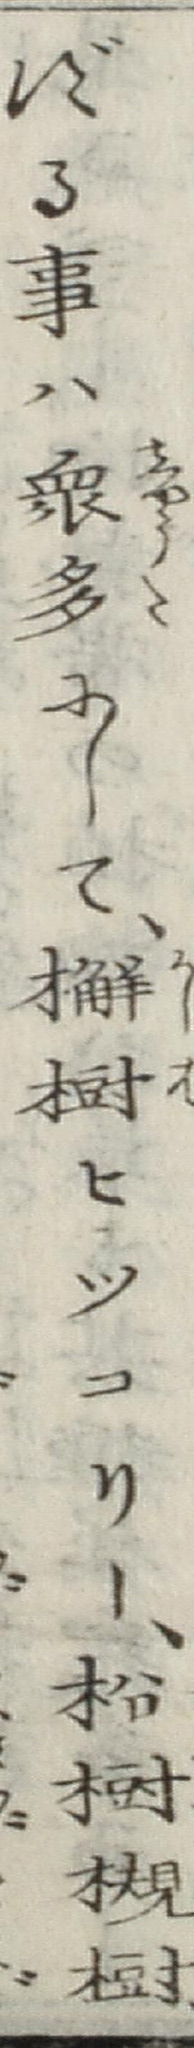ずる事は衆多にして、槲樹ヒツコリー、松樹、槻樹、
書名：訓蒙　天然地理學　下
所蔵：東京大学地震研究所図書室 Earthquake Research Institute Library, The University of Tokyo, JAPAN
